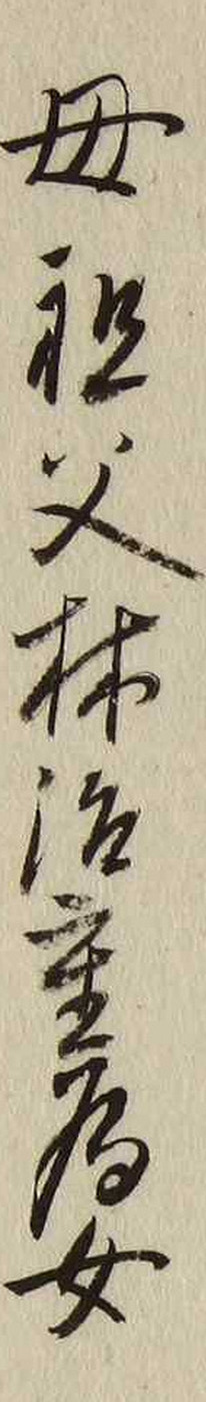母祖父林治重為女

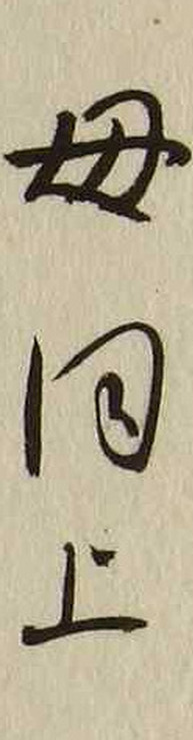母同上
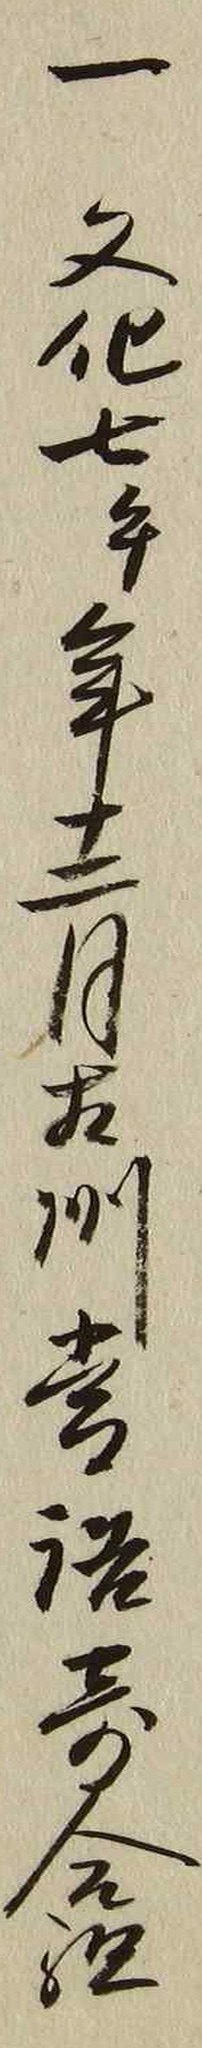一文化七午年十二月相州常詰寄合組
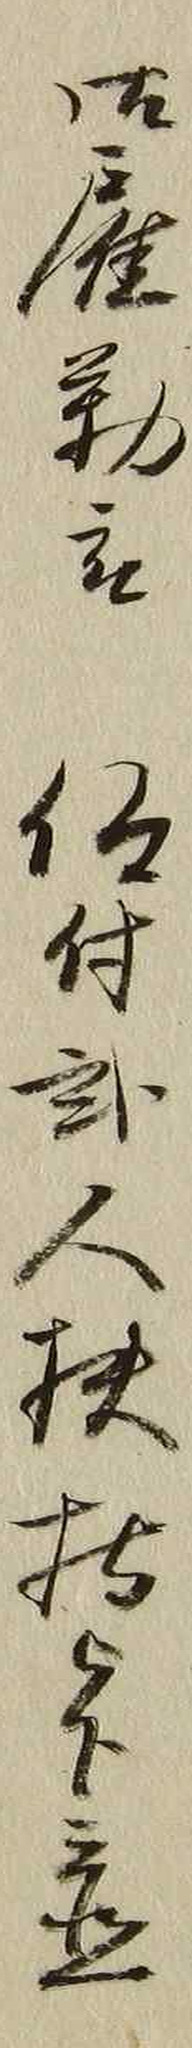御雇勤被仰付弐人扶持被下置
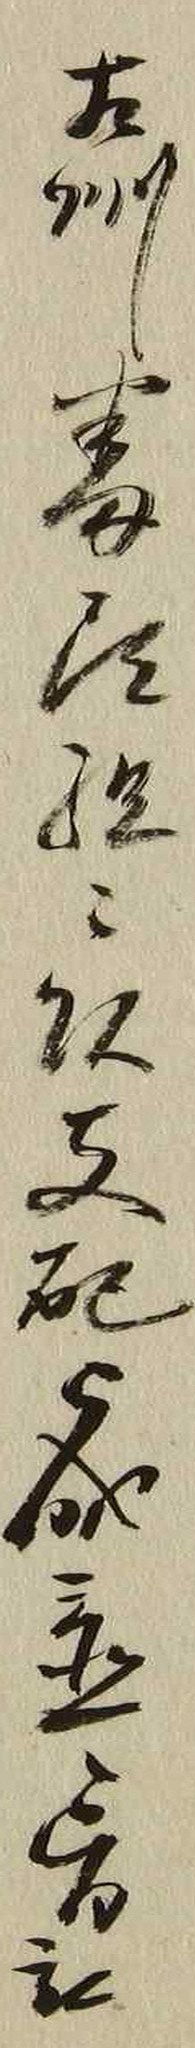相州番頭組ニ頭支配被成置候旨被
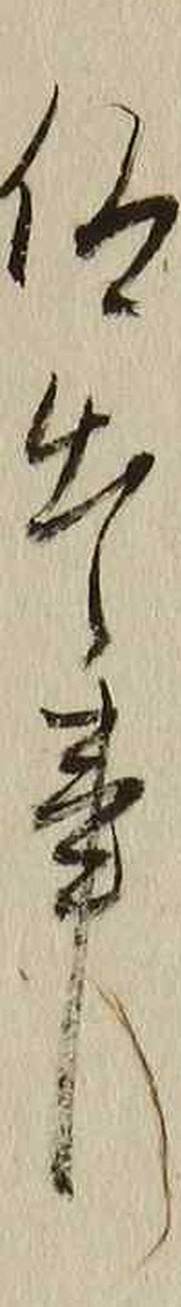仰出候事
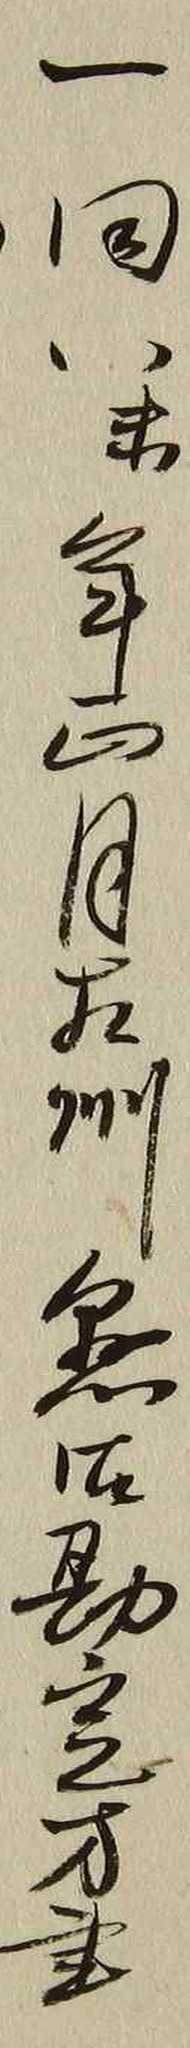一同八未年正月相州懸御勘定方書
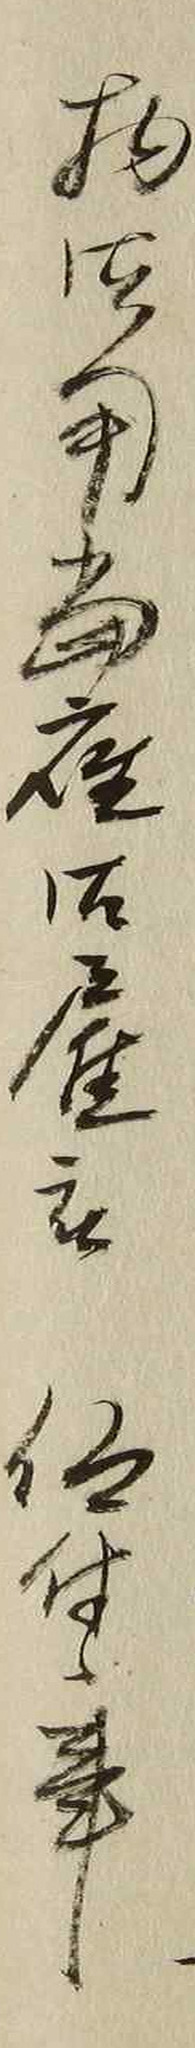物御用当座御雇被仰付候事
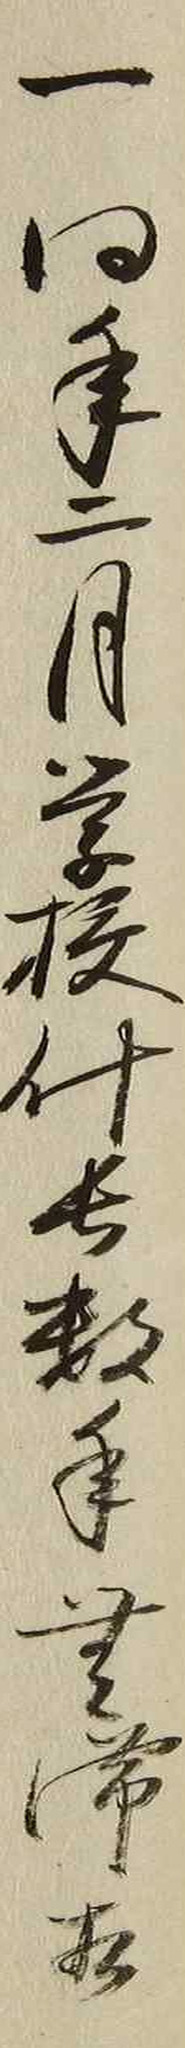一同年二月学校什長数年無滞相
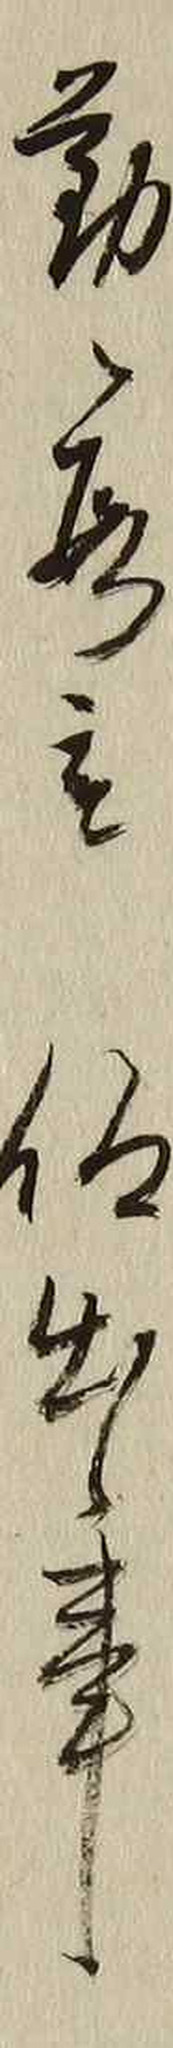勤候段被仰出候事
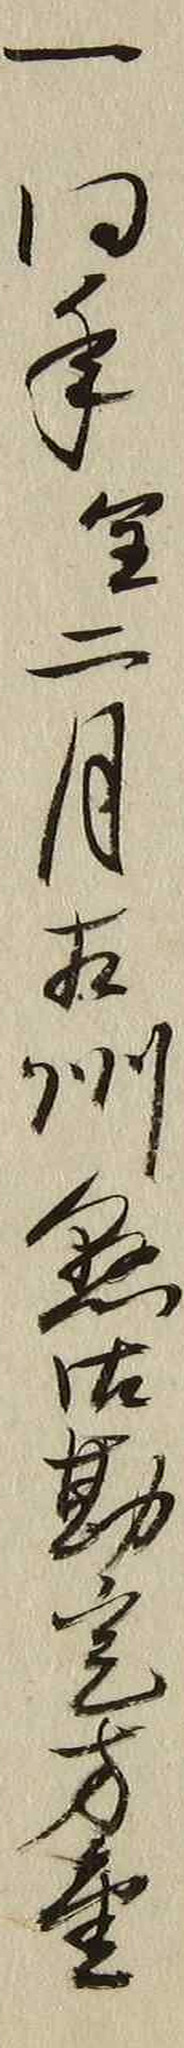一同年閏二月相州懸御勘定方金
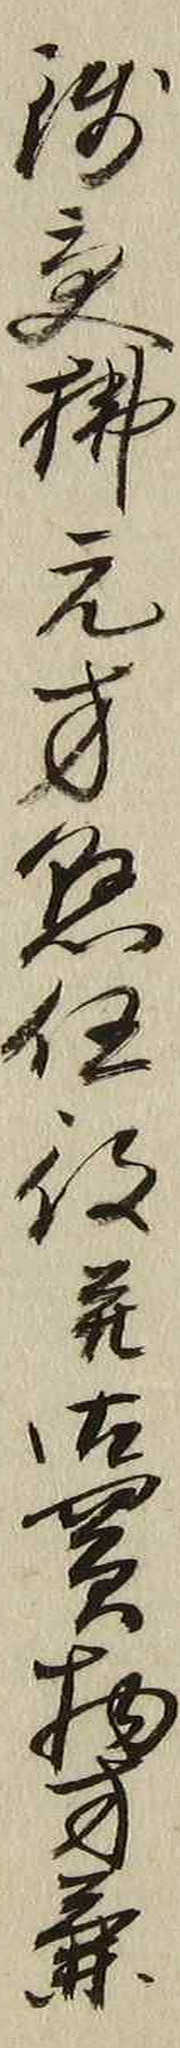銭受払元方懸任役并御買物方兼
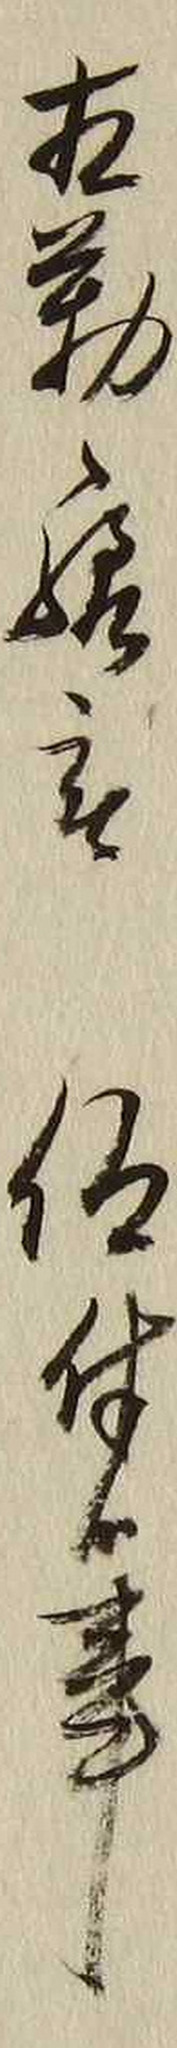相勤候様被仰付候事
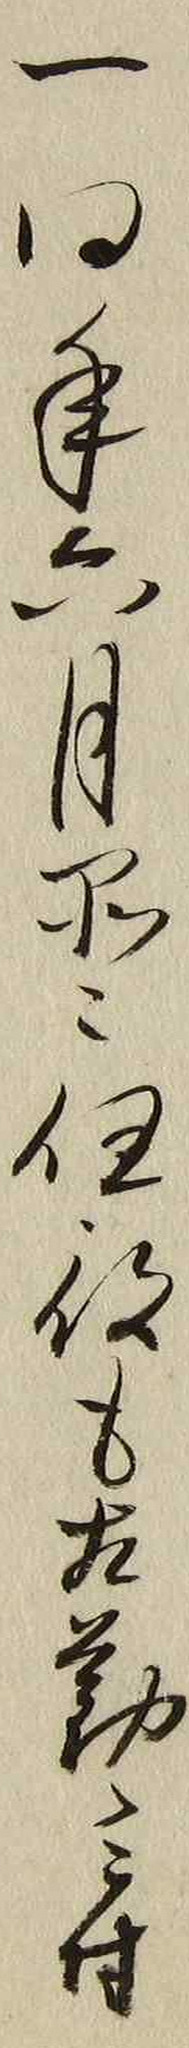一同年六月品々任役も相勤候ニ付
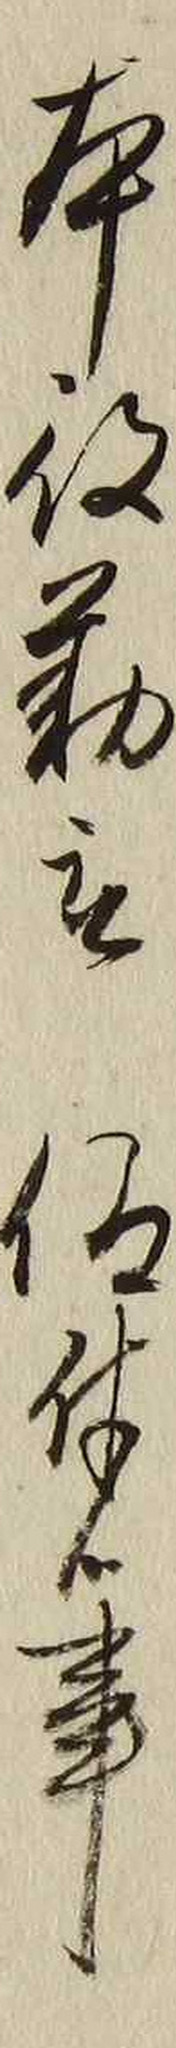本役勤被仰付候事
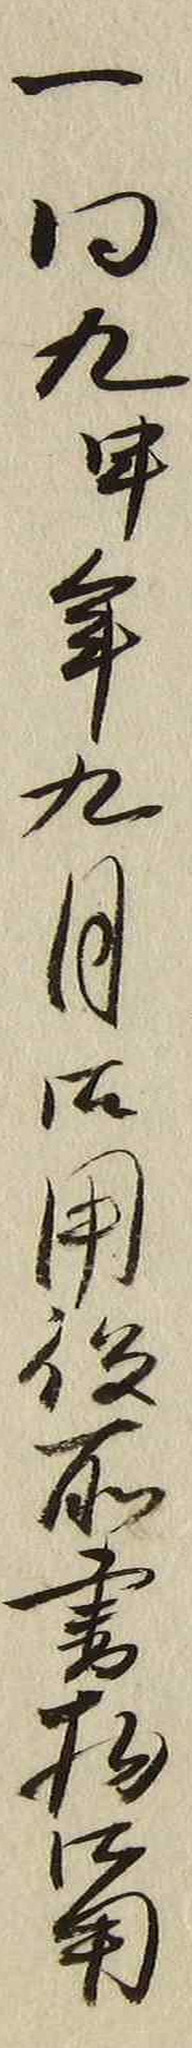一同九申年九月御用役所書物御用
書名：諸士系譜　巻之352　す之部2
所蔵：会津若松市立会津図書館
